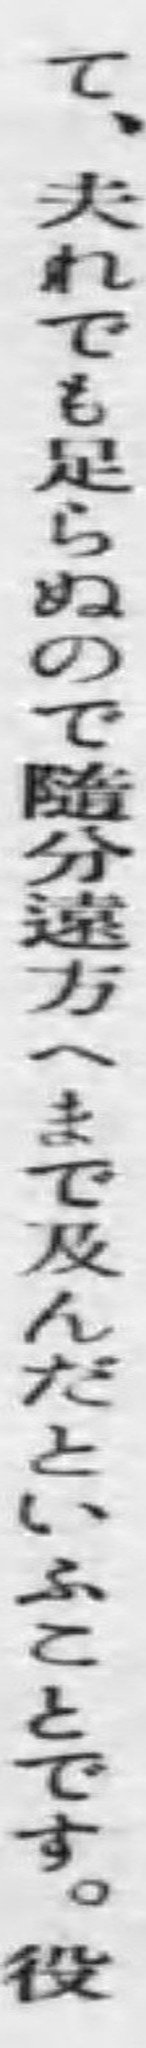て、夫れでも足らぬので随分遠方へまで及んだといふことです。役
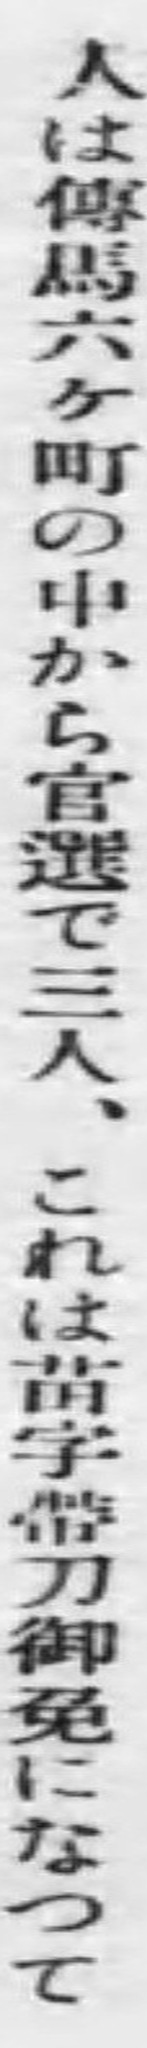人は伝馬六ヶ町の中から官選で三人、これは苗字帯刀御免になつて
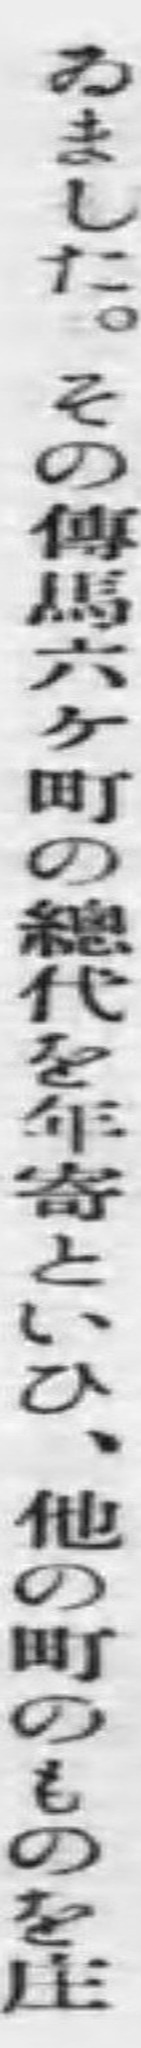ゐました。その伝馬六ヶ町の総代を年寄といひ、他の町のものを庄

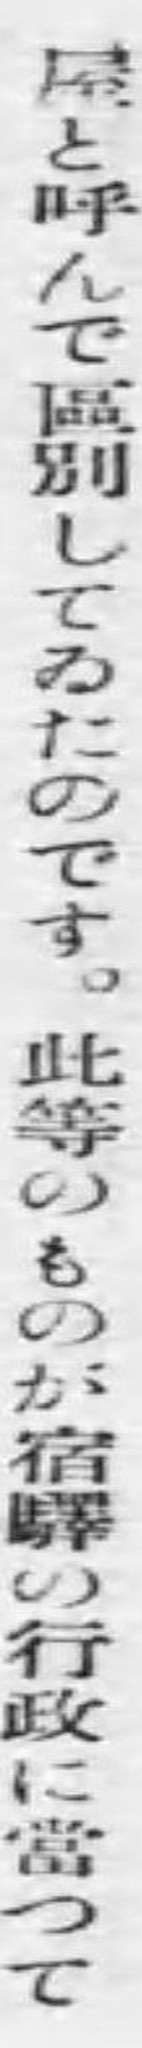屋と呼んで区別してゐたのです。此等のものが宿駅の行政に当つて
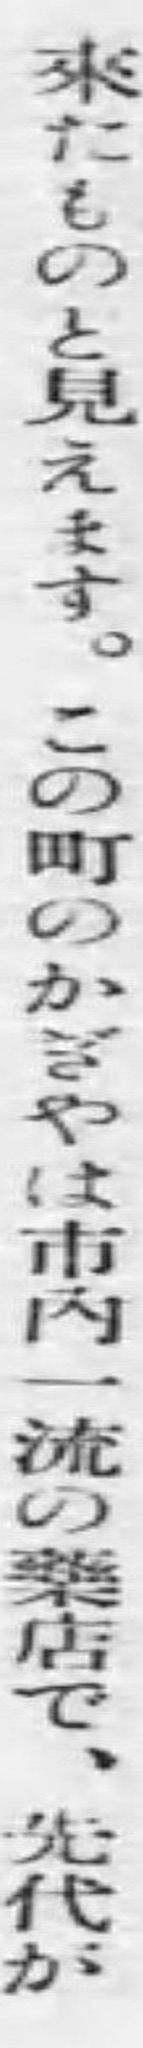来たものと見えます。この町のかぎやは市内一流の薬店で、先代が
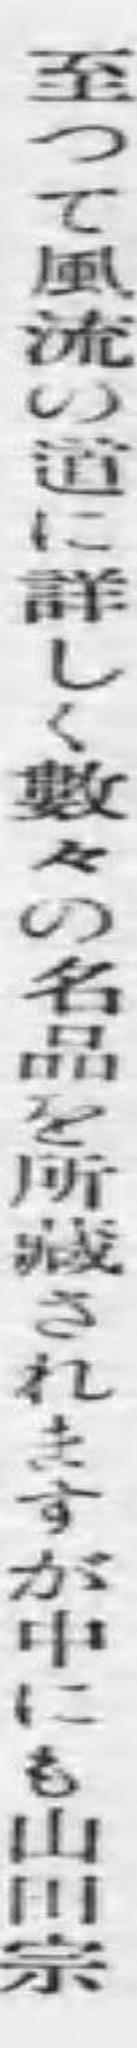至つて風流の道に詳しく数々の名品を所蔵されますが中にも山田宗
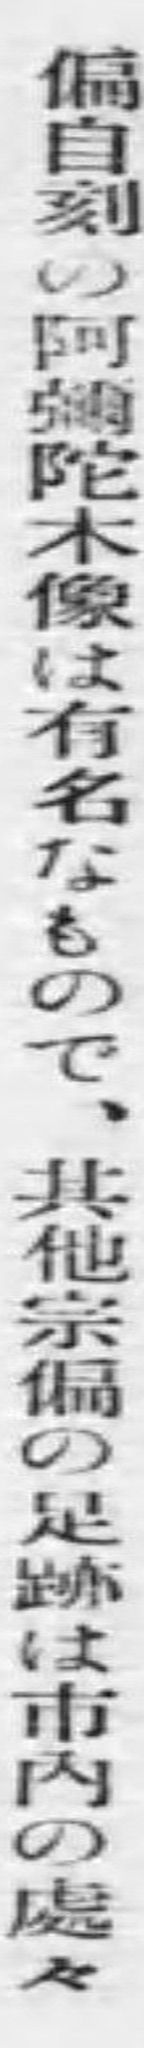偏自刻の阿弥陀木像は有名なもので、其他宗偏の足跡は市内の処々
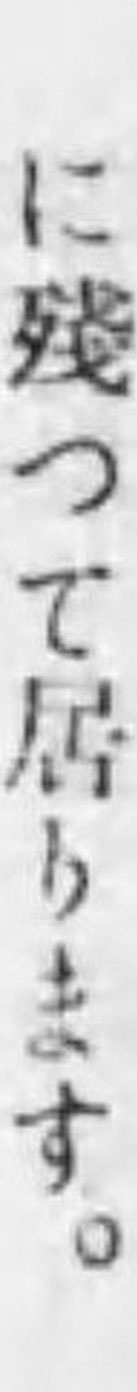に残つて居ります。
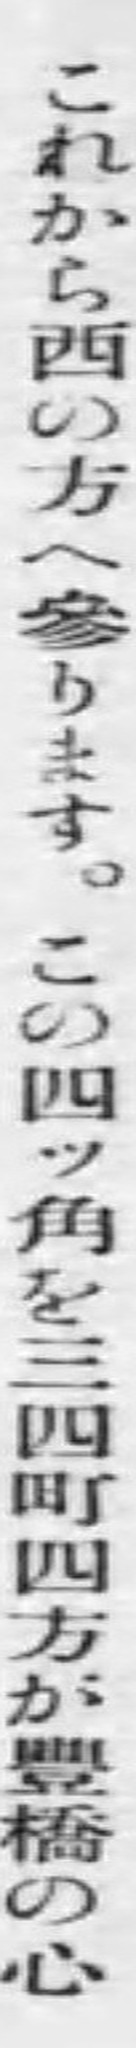これから西の方へ参ります。この四ッ角を三四町四方が豊橋の心
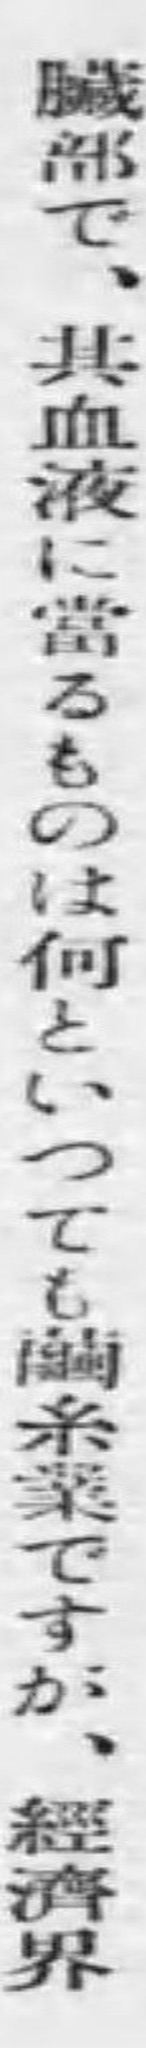臓部で、其血液に当るものは何といつても繭糸業ですが、経済界
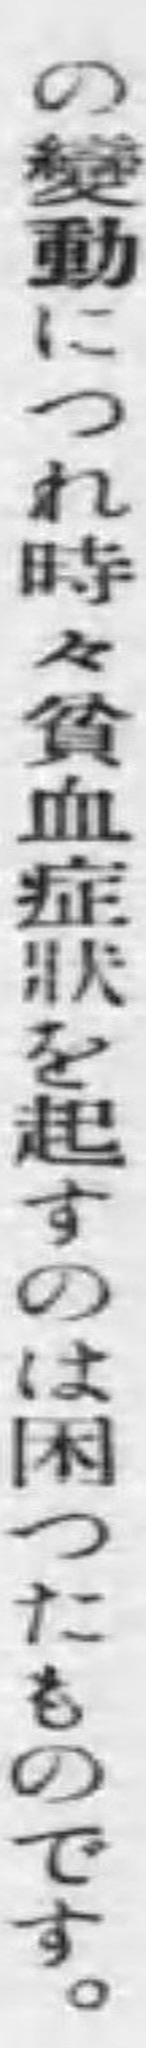の変動につれ時々貧血症状を起すのは困つたものです。
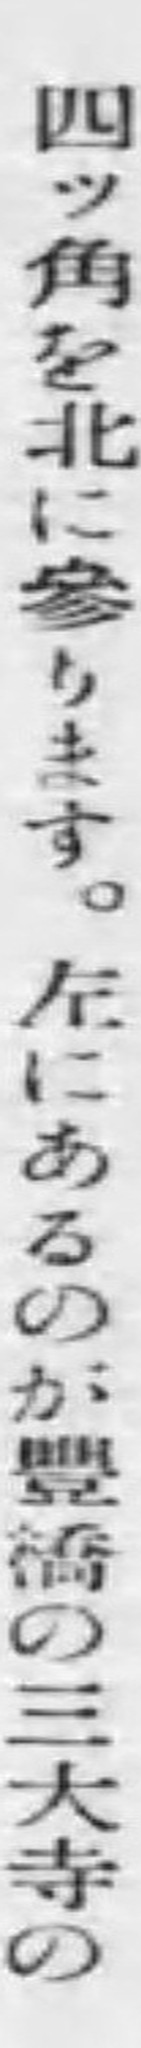四ッ角を北に参ります。左にあるのが豊橋の三大寺の
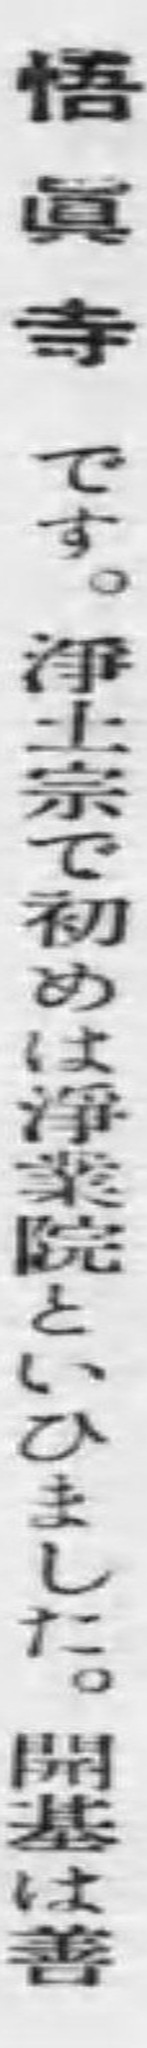悟真寺です。浄土宗で初めは浄業院といひました。開基は善
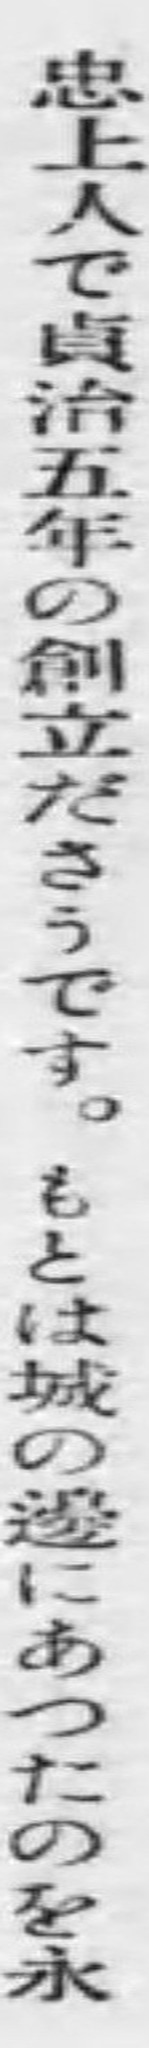忠上人で貞治五年の創立ださうです。もとは城の辺にあつたのを永
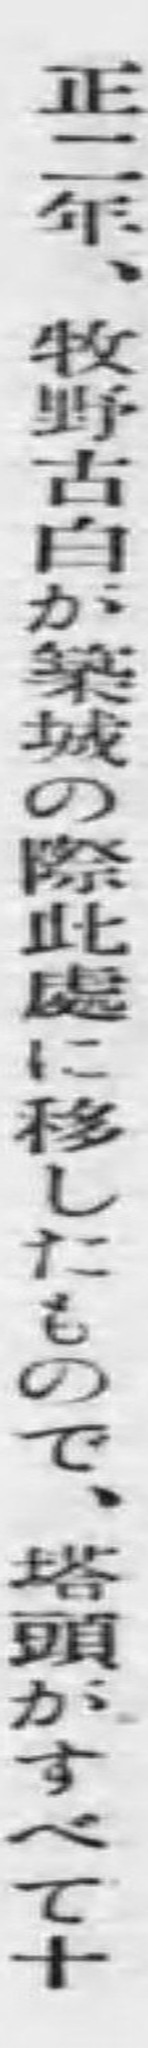正二年、牧野古白が築城の際此処に移したもので、塔頭がすべて十
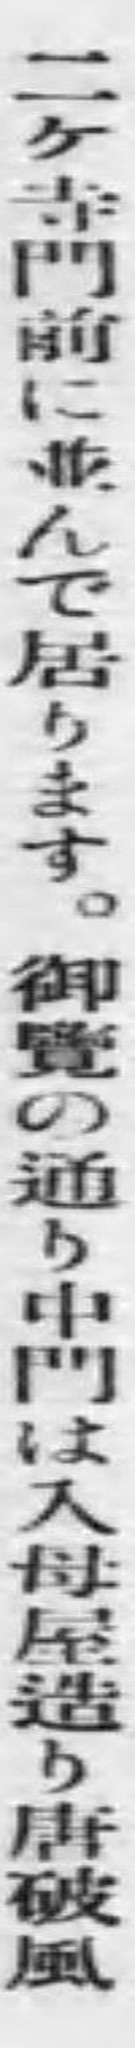二ヶ寺門前に並んで居ります。御覧の通り中門は入母屋造り唐破風
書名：東三河道中記 : 豊橋市及其附近案内
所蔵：国立国会図書館 National Diet Library, JAPAN
